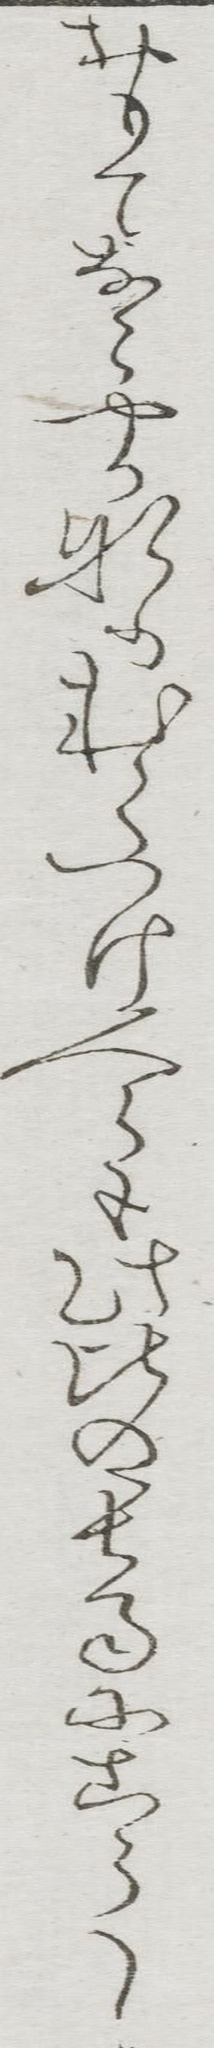おもてなこやかなりむくつけ人々も此比の長雨にこうし
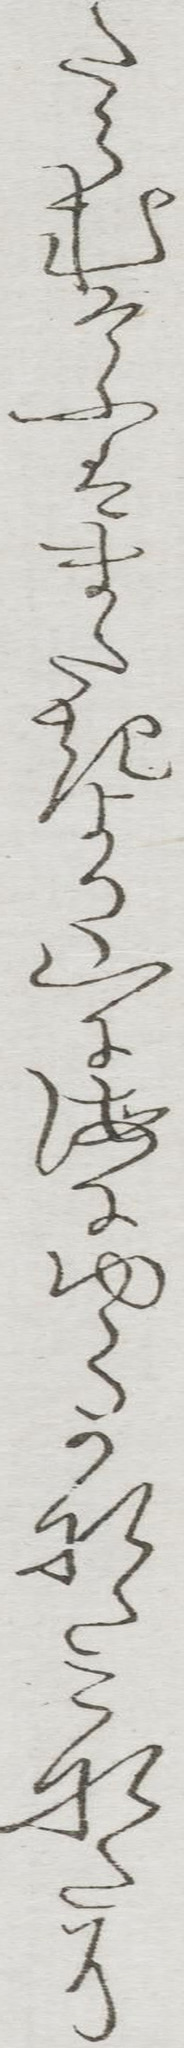たらむけふはまたきより山に海にゆくかなたこなたに
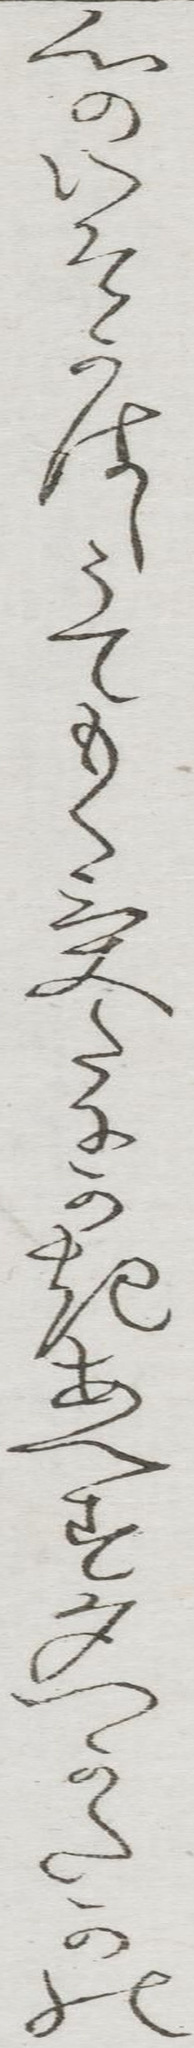心のいそかはしうてもくすたにかきあへす夕つかたかの
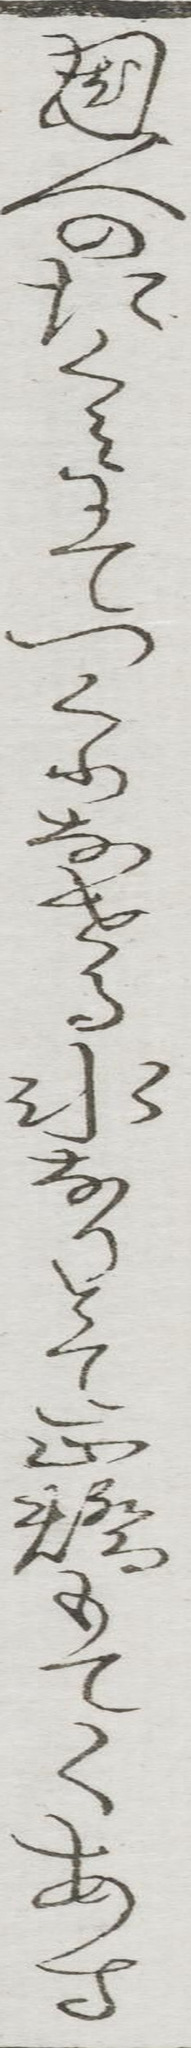国人のたくみにてつくりなせる氷なりとて正矯もてくあす
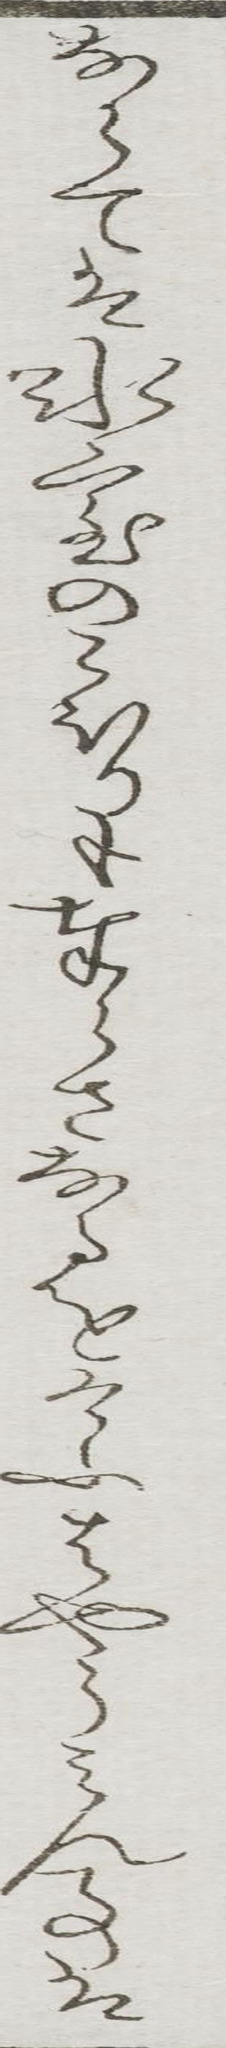ならては氷室のこほりも奉らさなるをけふはやうみん事は
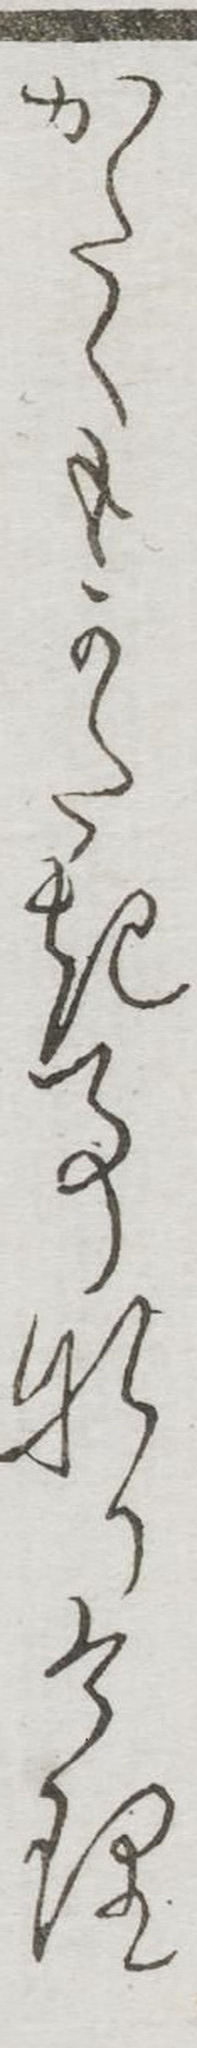かたくもかたき事なりけり

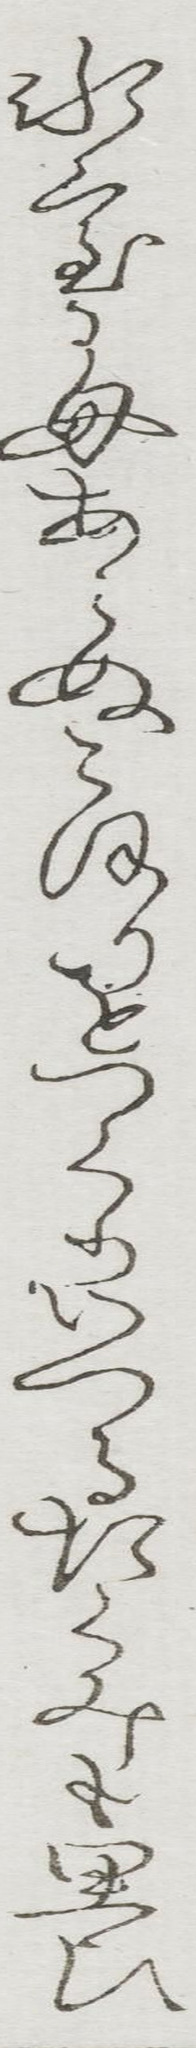氷室にもあらぬこほりをつくりいつるたくみも思ひ
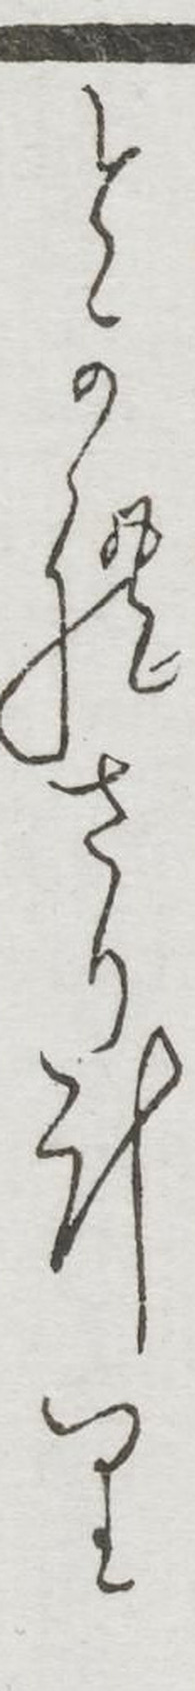とかれさりけり
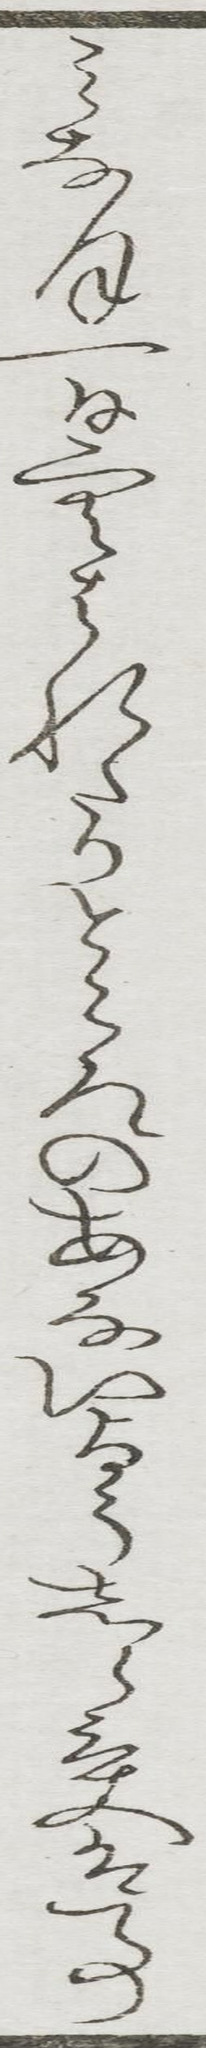みな月一日空はれたりところのあなひようしらすは事
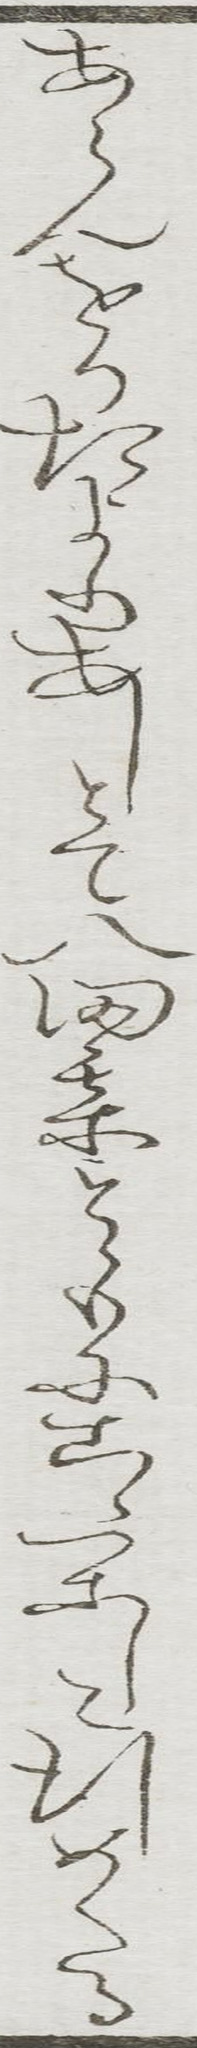あらんをりたよりあしとて八田某とゝもにこゝかしこ行めくる
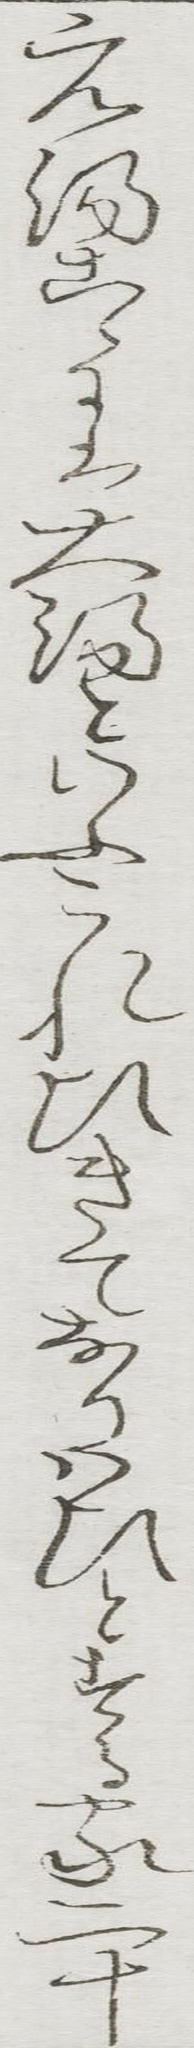元湯こゝには大湯といふこれひきてなりはひとする家二十
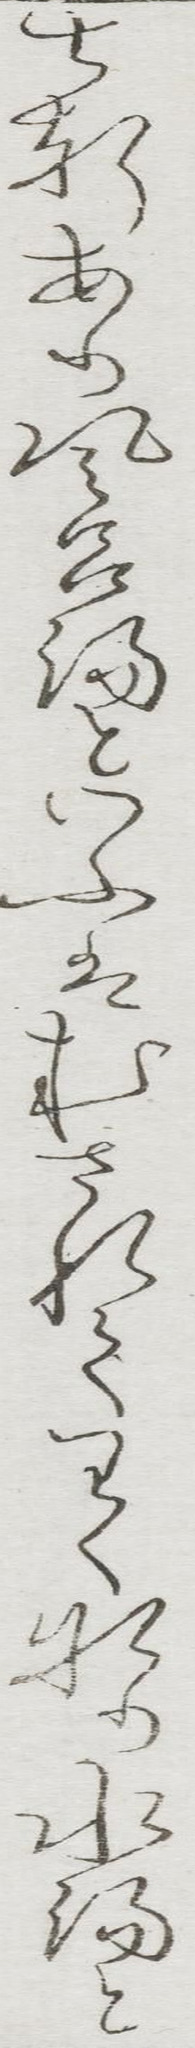七軒あり風呂湯といふはむされてわくなり水湯と
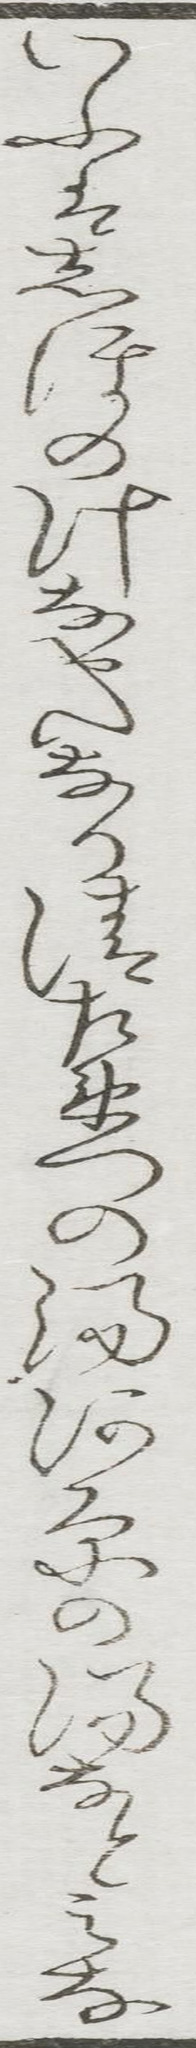いふはしほのけなきなり清左衛門の湯河原の湯なとみな
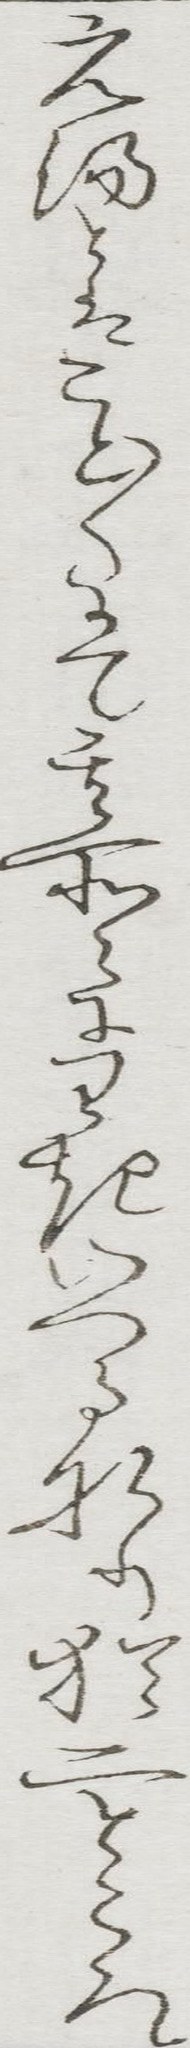元湯とはこと〳〵にて其所々にわきいつるなり猶二ところ
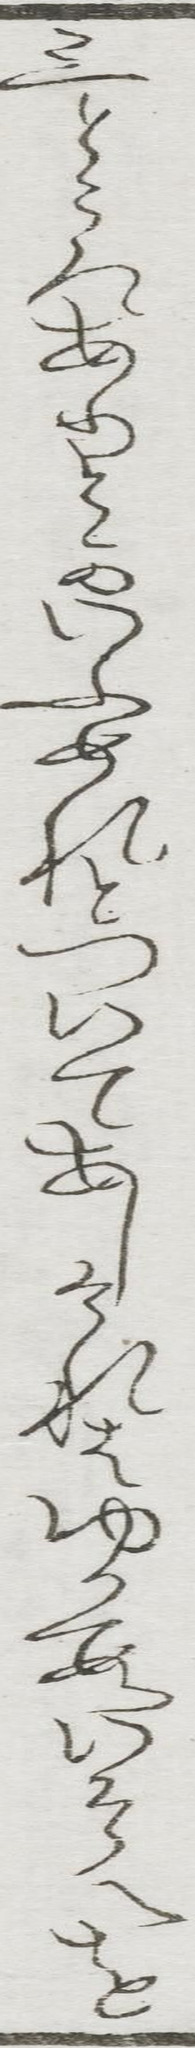三ところありとかいふめれとついてあしけれはゆかすいそへを
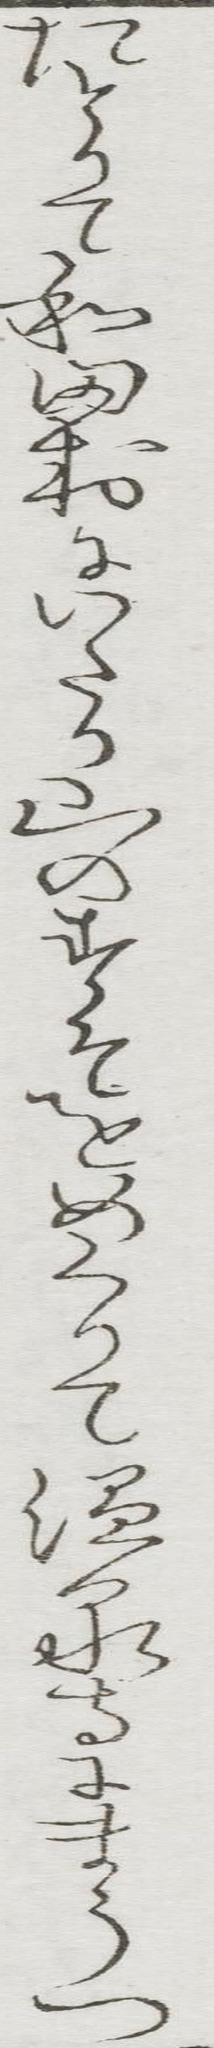たとりて和田村にいたり山のすそをめくりて温泉寺にまうつ
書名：挿画熱海日記　全
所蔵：東京大学地震研究所図書室 Earthquake Research Institute Library, The University of Tokyo, JAPAN
